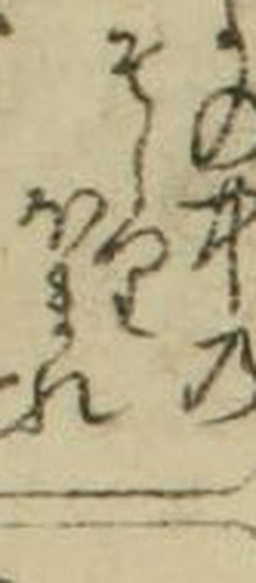ほまれ
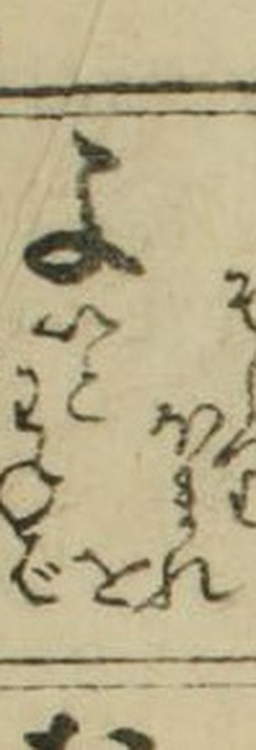いとはねば
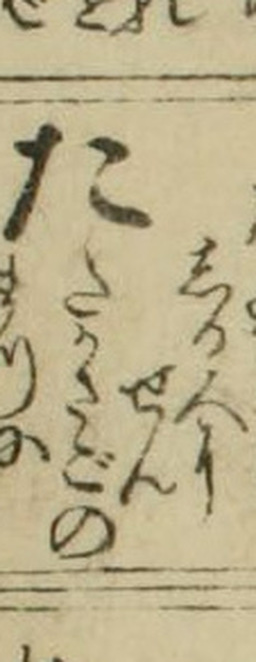たかさごの
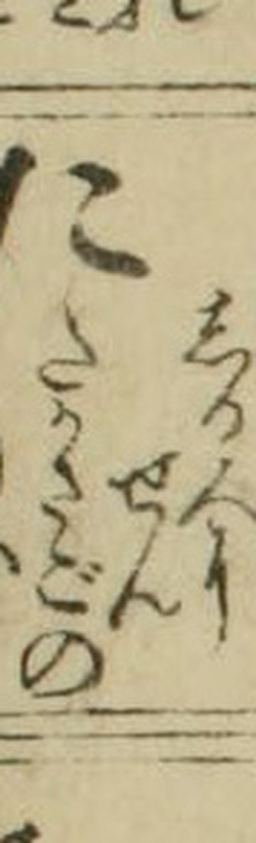たかさごの
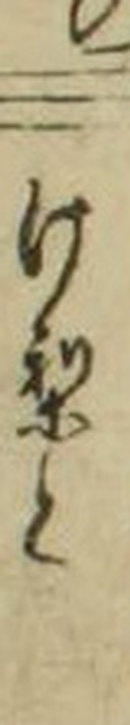けりと
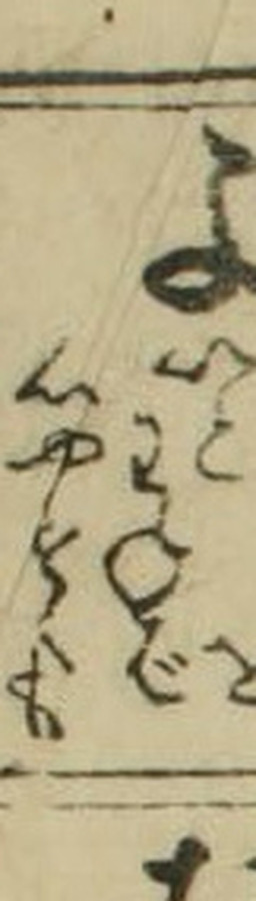心やすくも
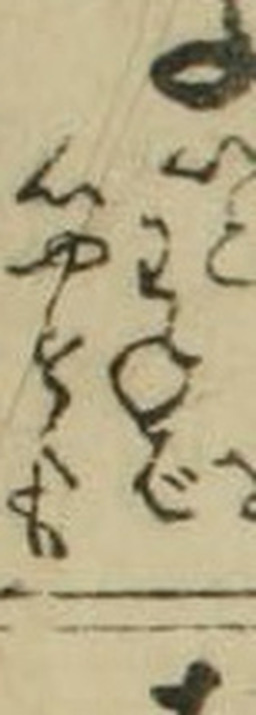心やすくも
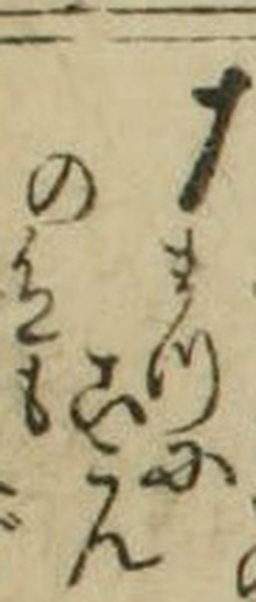の色も
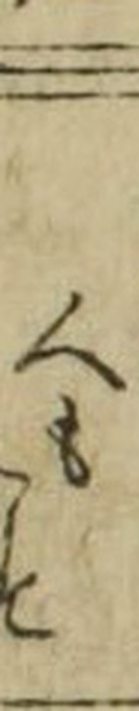人もこそ
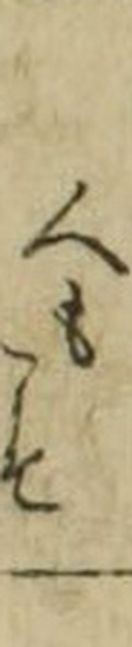人もこそ

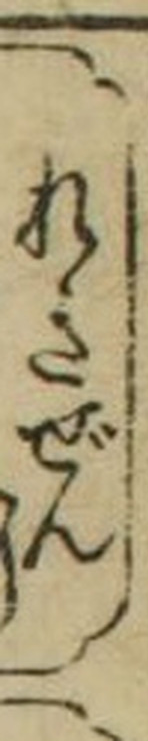れきぜん
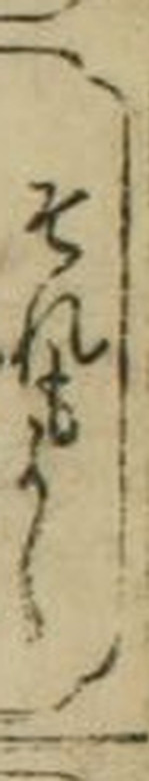それもよし
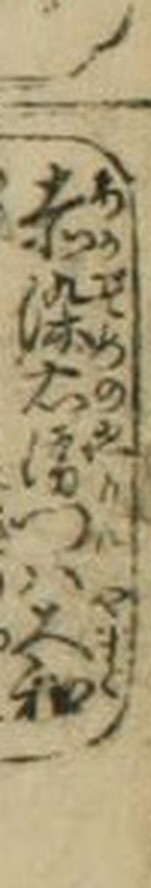赤染右衛門は大和
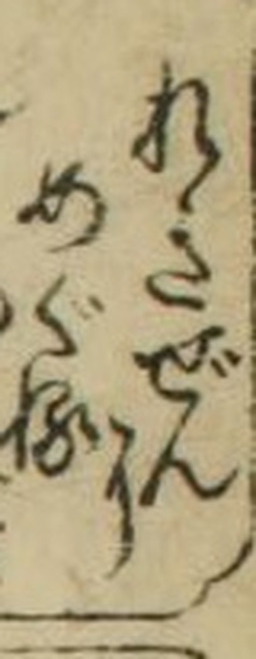めぐる
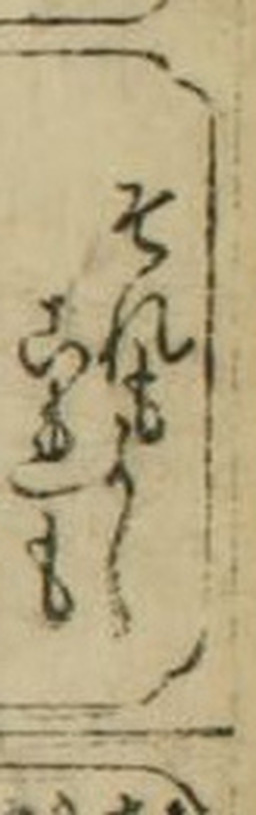これも
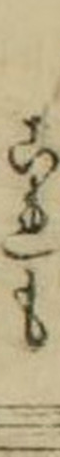これも
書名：女源氏教訓鑑
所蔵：東京学芸大学附属図書館
